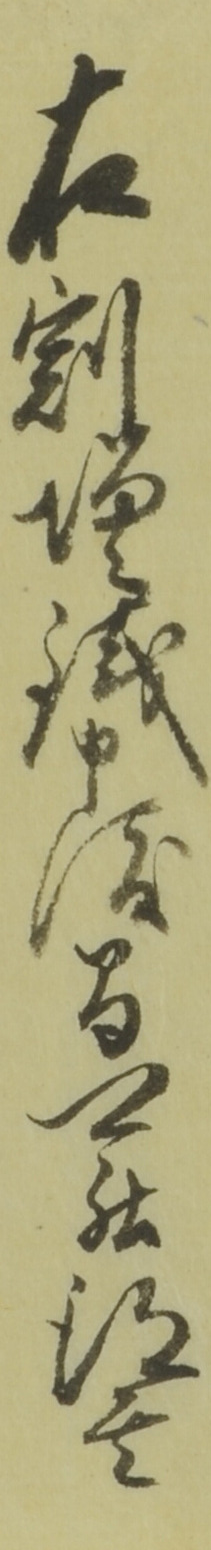右割増銭申渡間可被得其
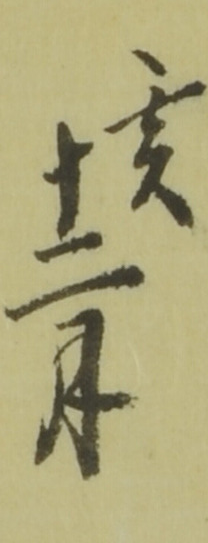十二月
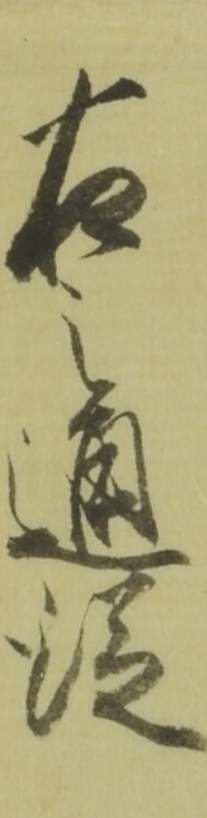右之通従
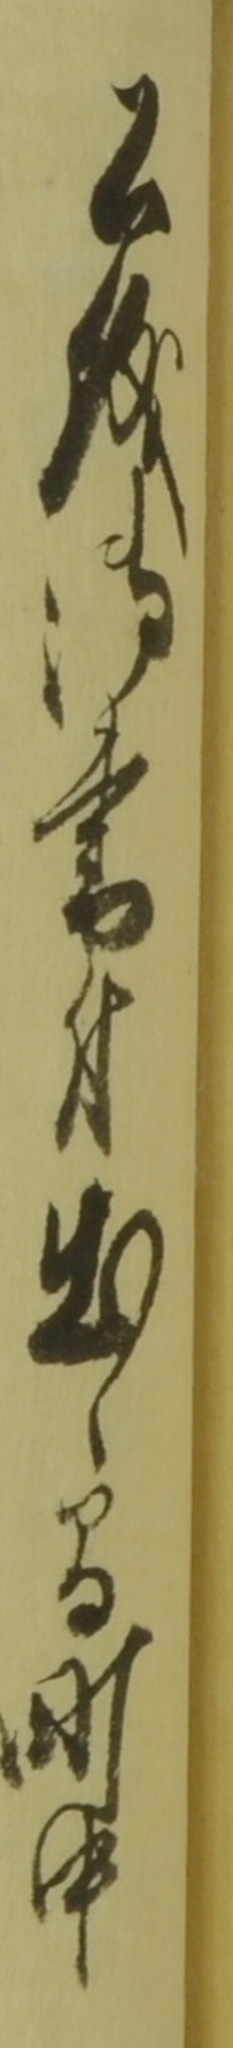公儀御書付出候間町中
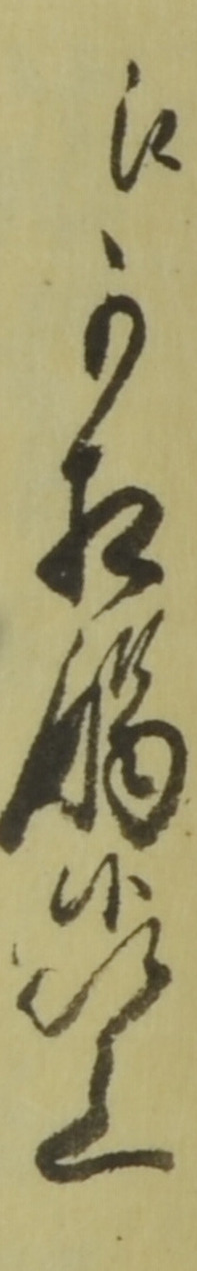江可相触候以上

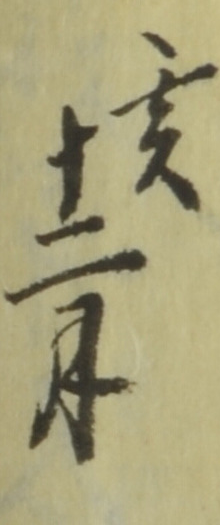十二月
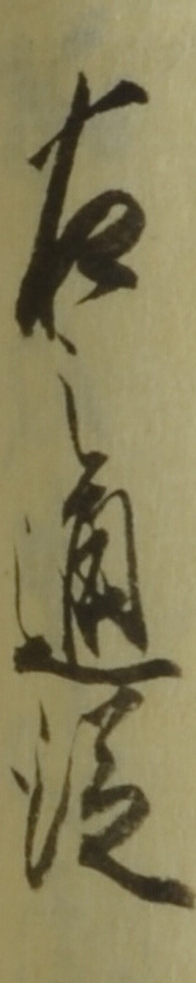右之通従
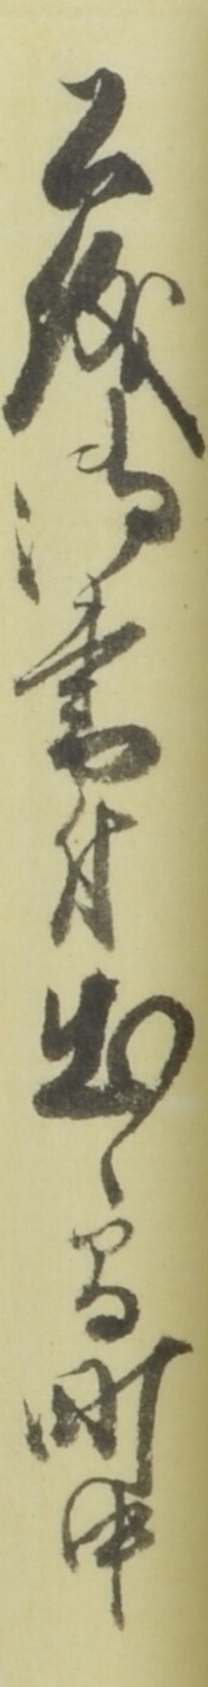公儀御書付出候間町中
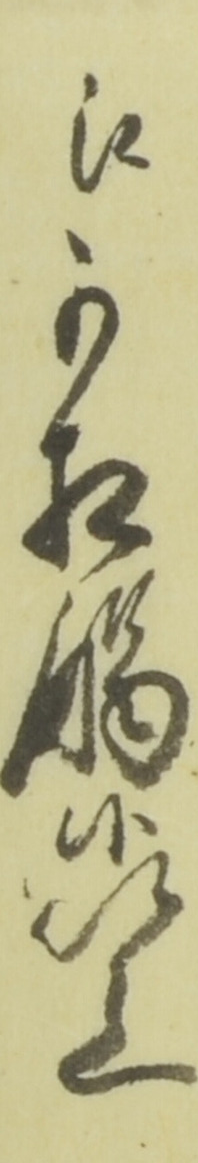江可相触候以上
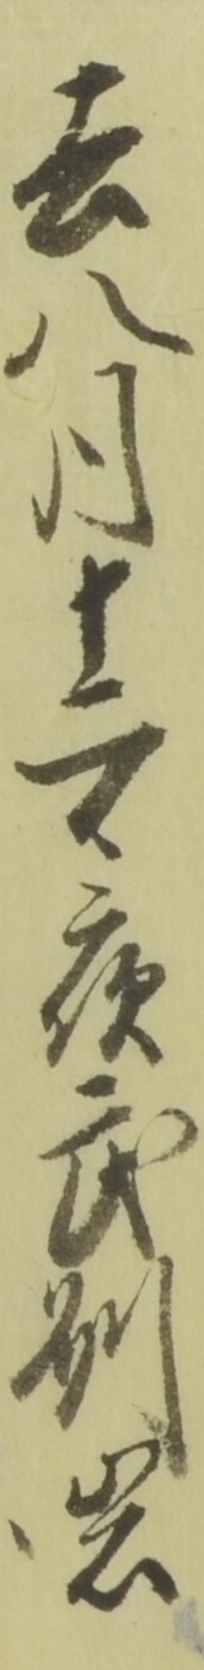去八月十二日夜武州岩
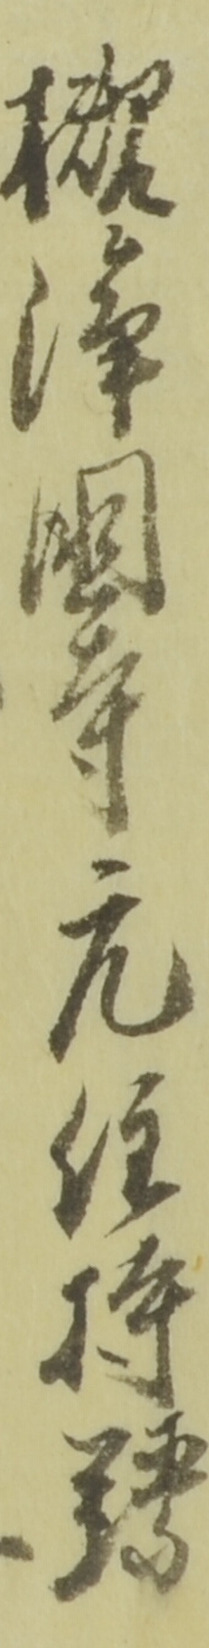槻浄国寺元住持驃
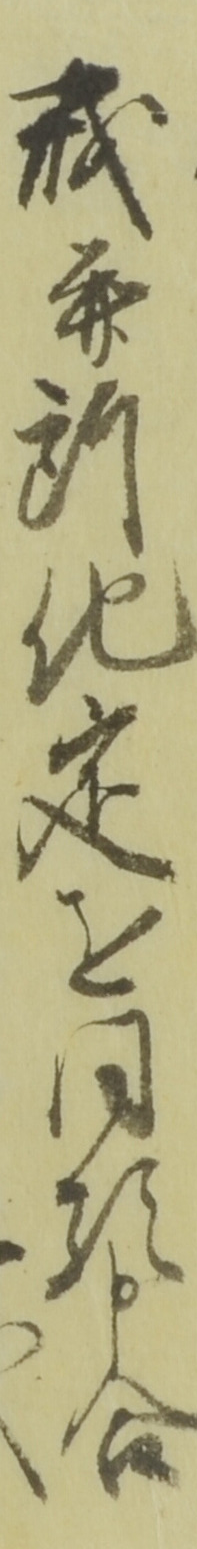戒并所化定を同類申合
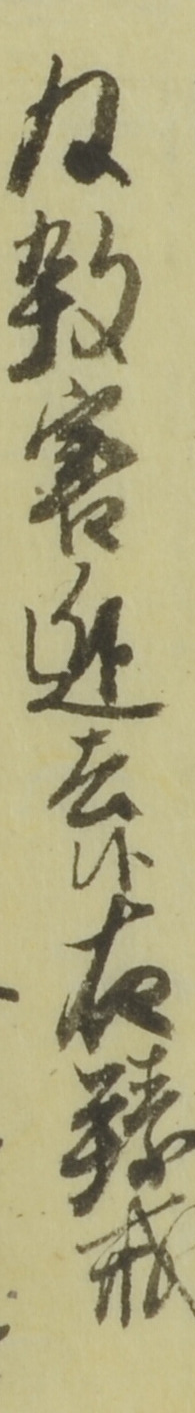為殺害逃去候右驃戒
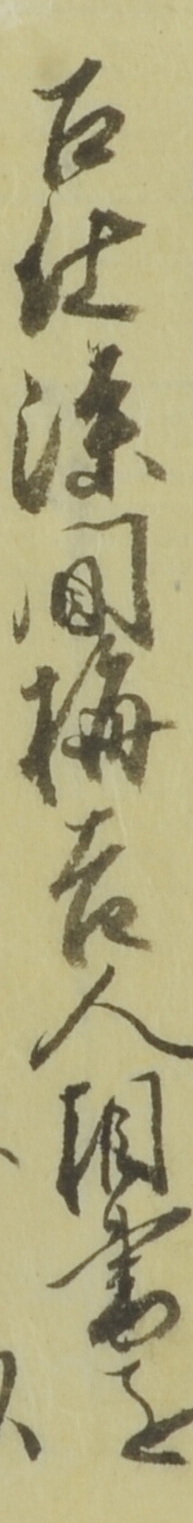召仕沫間梅吉人相書を
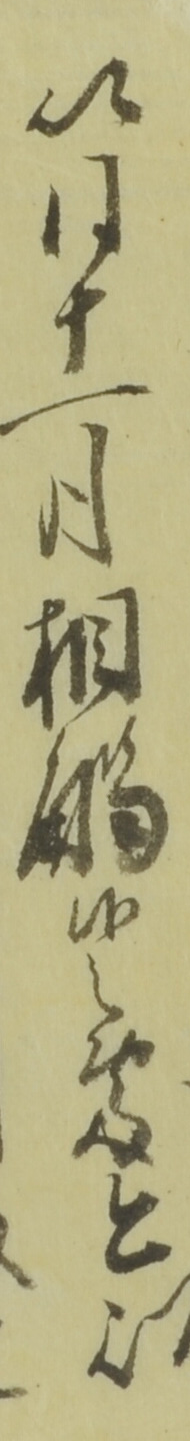以同十一月相触候之処今以
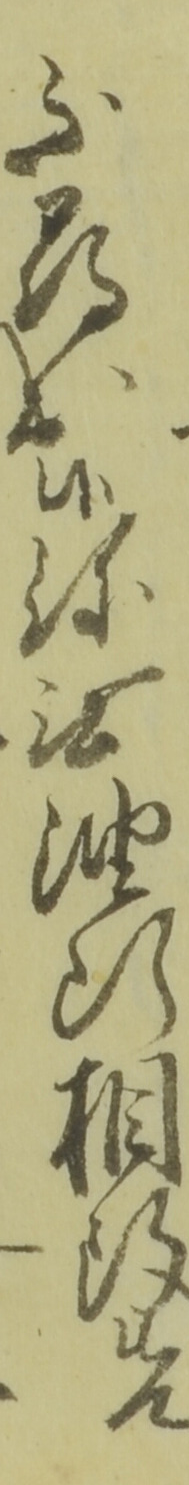不尋出候弥無断相改先
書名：御触書御書附控
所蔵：伊那市立高遠町図書館・合同会社AMANE
